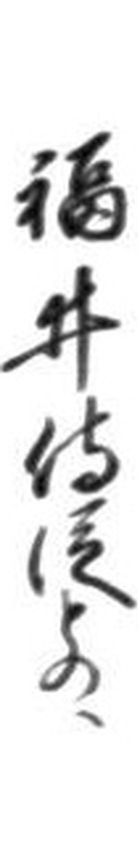福井侍従とのヘ

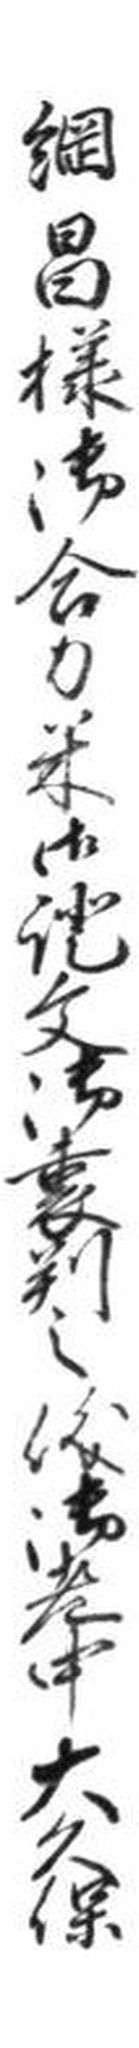綱昌様御合力米御証文御裏判之儀御老中大久保
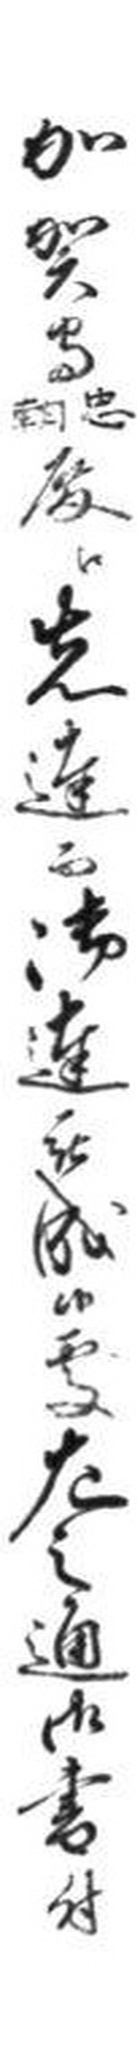加賀守忠朝殿江先達而御達被成候處左之通御書付
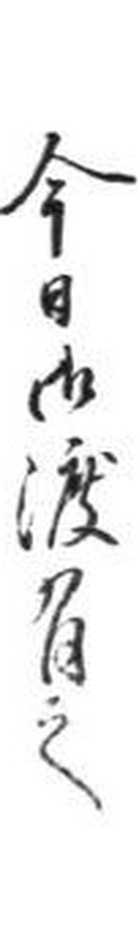今日御渡有之
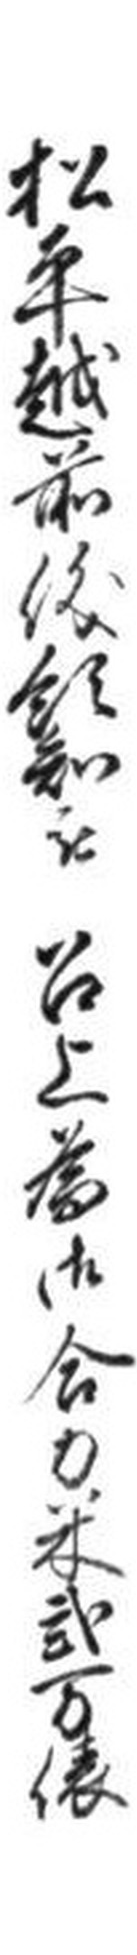松平越前儀領知被召上為御合力米弐万俵
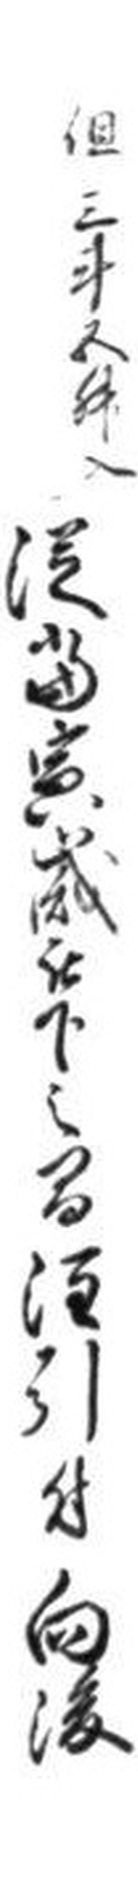但三斗五升入従当寅年被下之間注引付向後
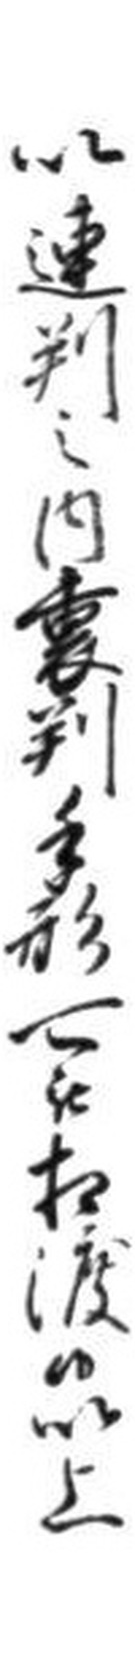以連判之内裏判手形可被相渡候以上
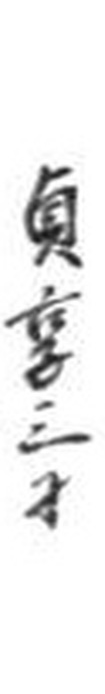貞享三刁
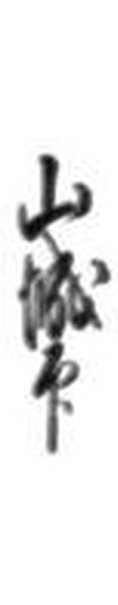山城印
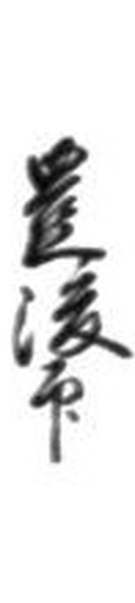豊後印
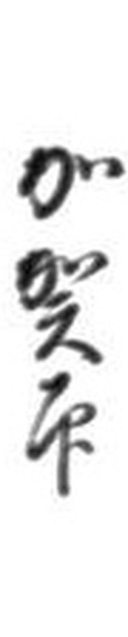加賀印
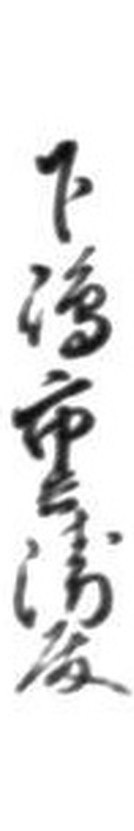下嶋市兵衛殿
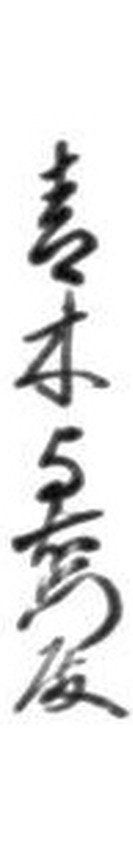青木与右衛門殿
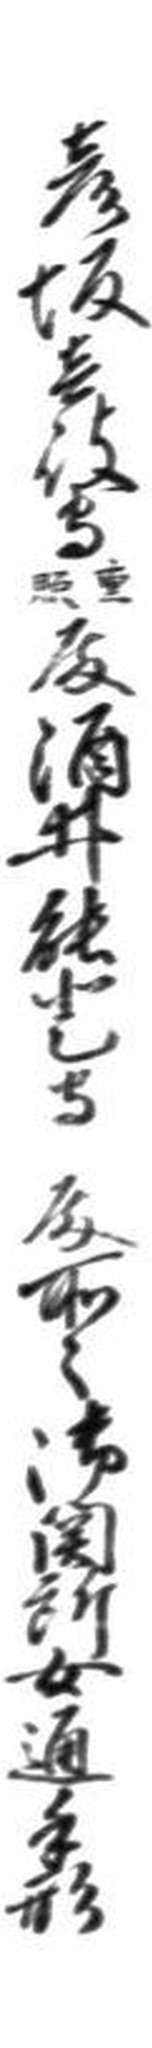彦坂壱岐守重照殿酒井能登守殿所々御関所女通手形
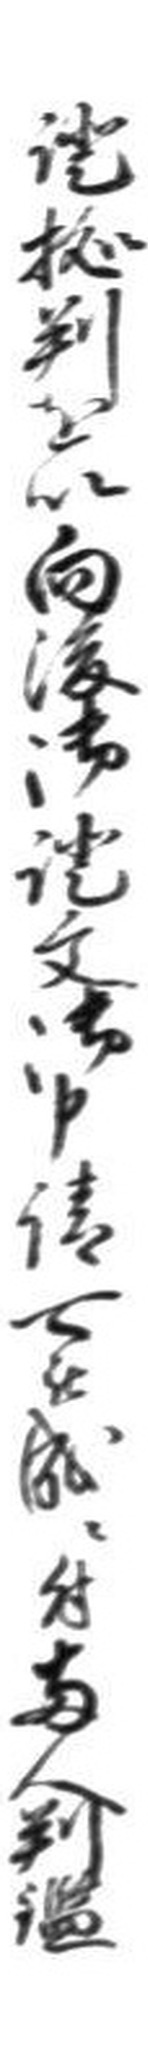証拠判を以向後御証文御申請可被成ニ付両人判鑑
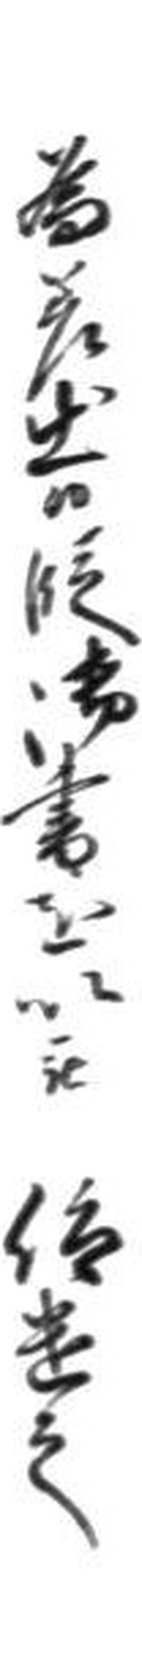為差出候段御書を以被仰遣之
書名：家譜 十六 吉品公 従貞享三年閏三月到同四年
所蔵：福井県文書館 Fukui Prefectural Archives
